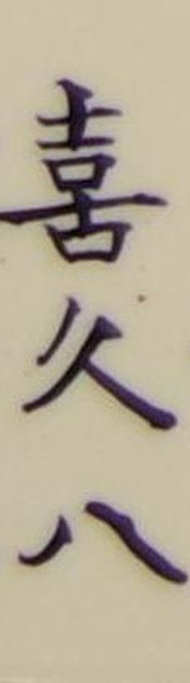喜久八
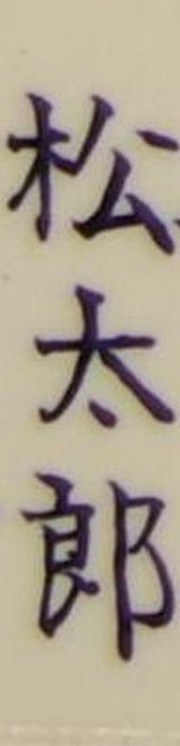松太郎

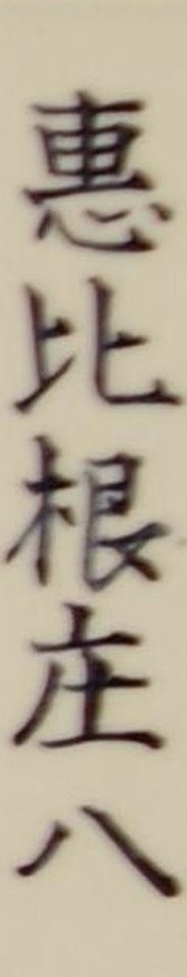惠比根庄八
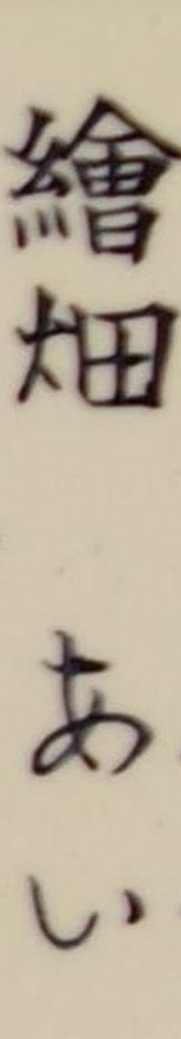絵畑あい
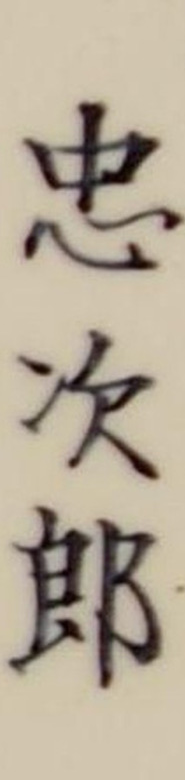忠次郎
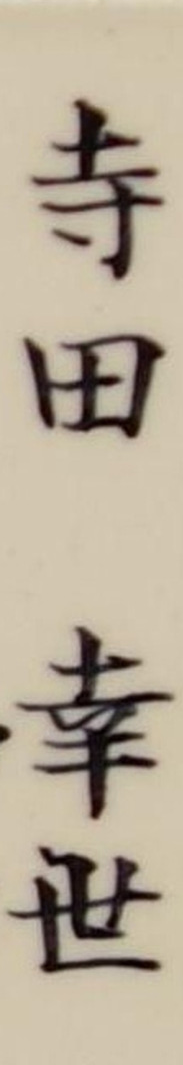寺田幸世
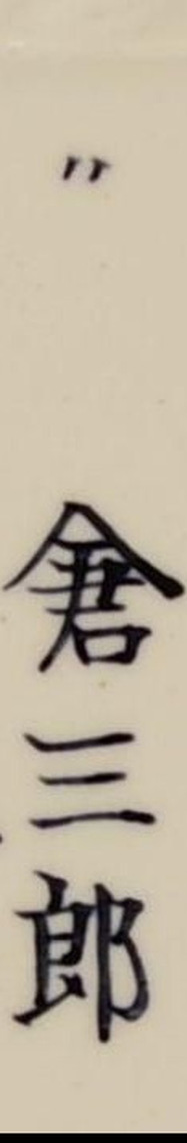倉三郎
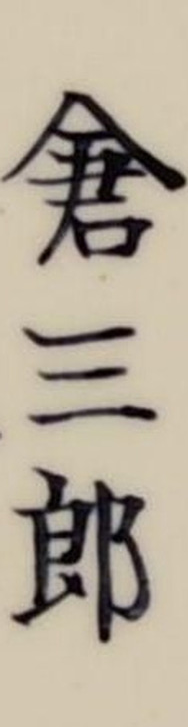倉三郎
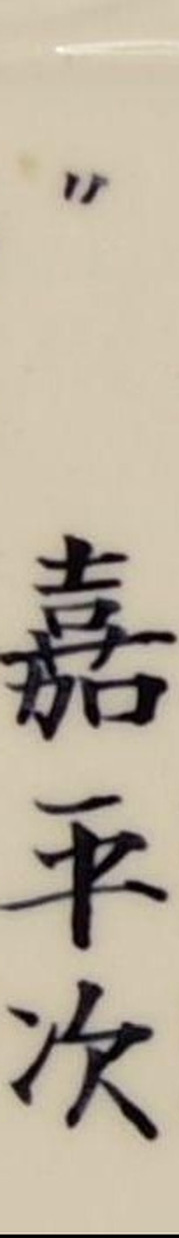嘉平次
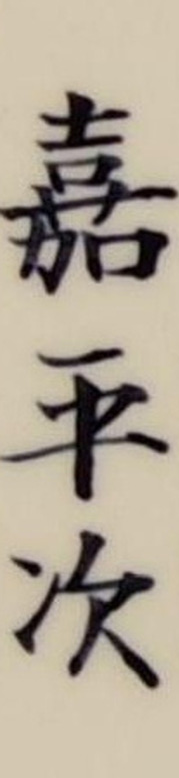嘉平次
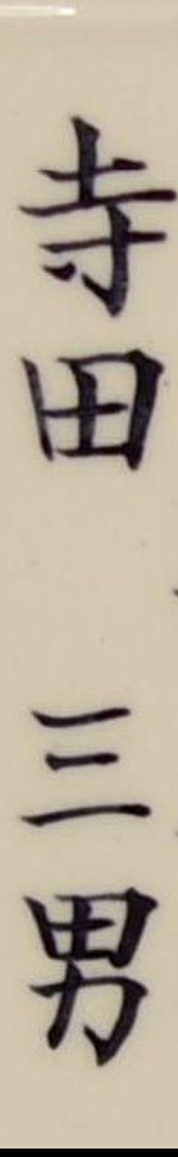寺田三男

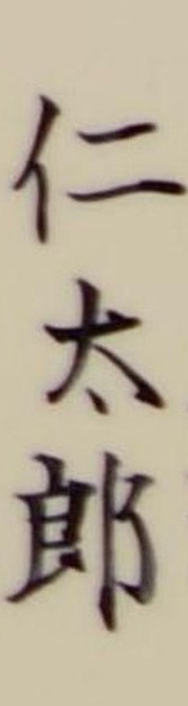仁太郎
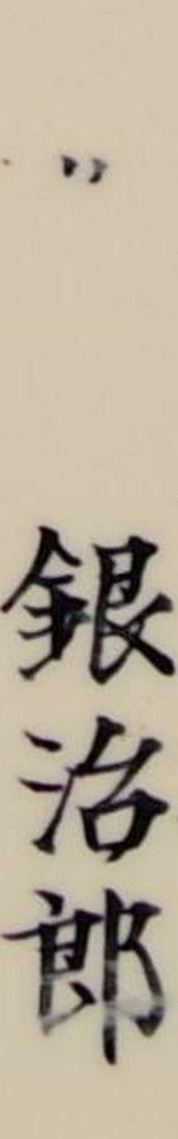銀治郎
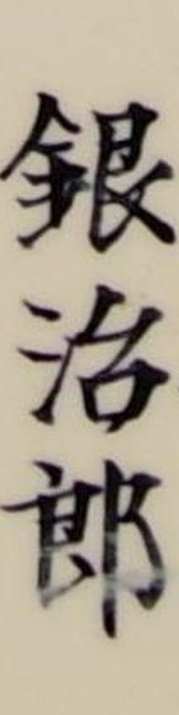銀治郎
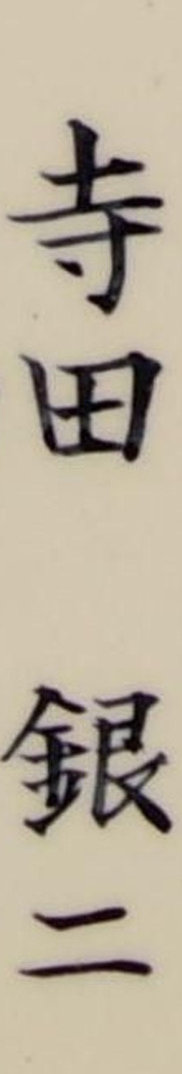寺田銀二
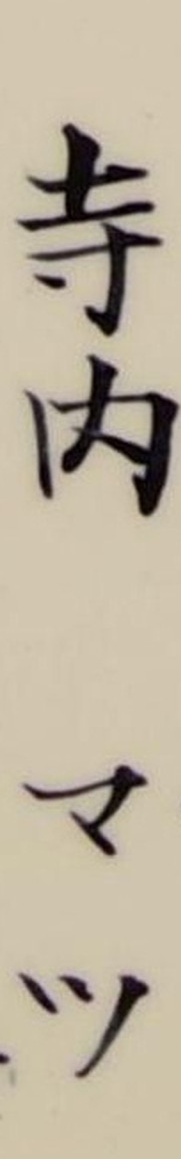寺内マツ
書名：E~L
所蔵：高野山金剛峯寺
